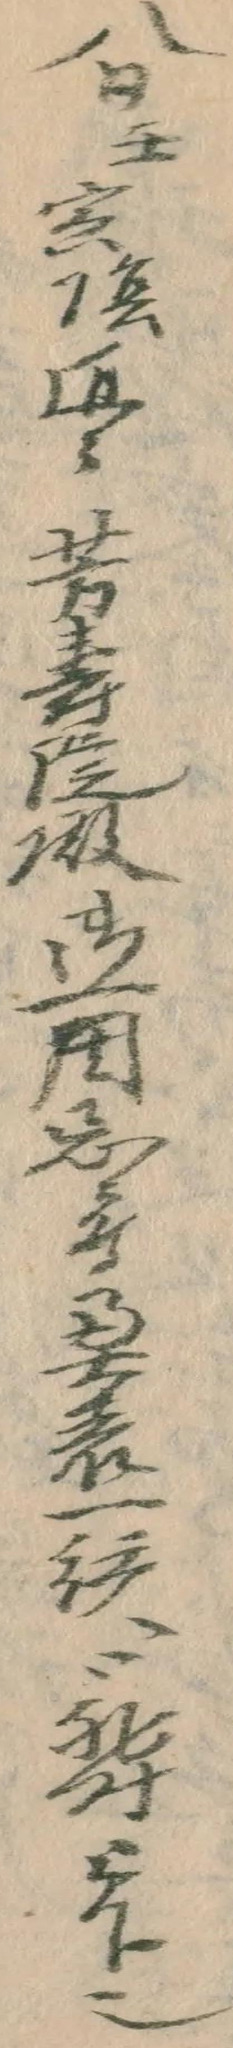八日壬寅陰近々芳壽院殿御一周忌ニ付奥表一統へ御時被下也
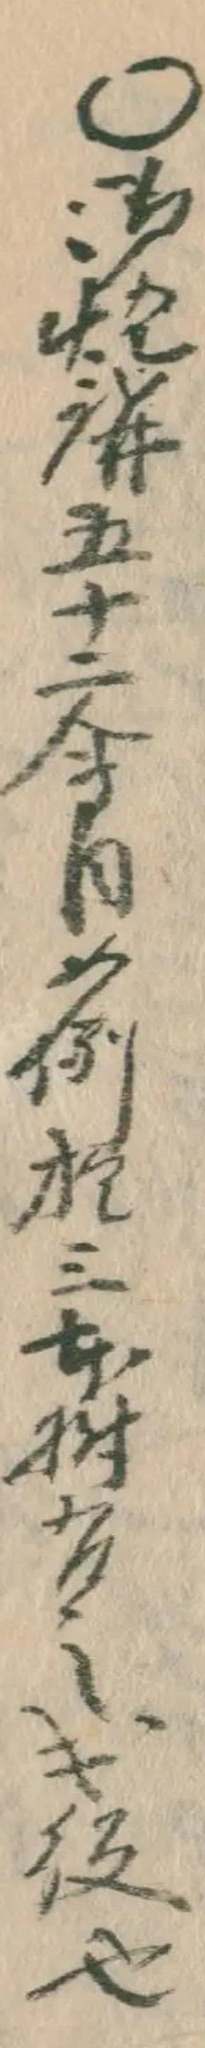○御燈講五十二會日如例於三本樹有之出役也
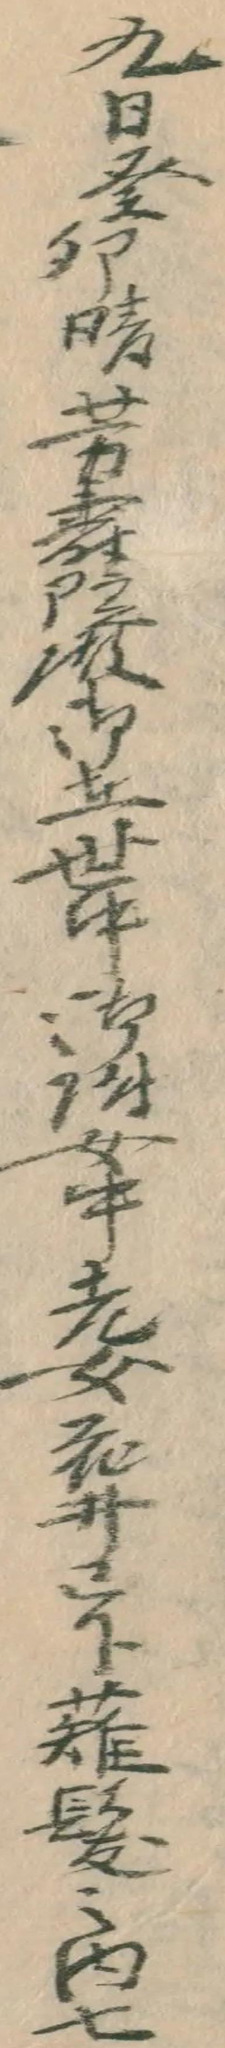九日癸卯晴芳壽院殿御在世中御附女中老女花井已下薙髪之内七
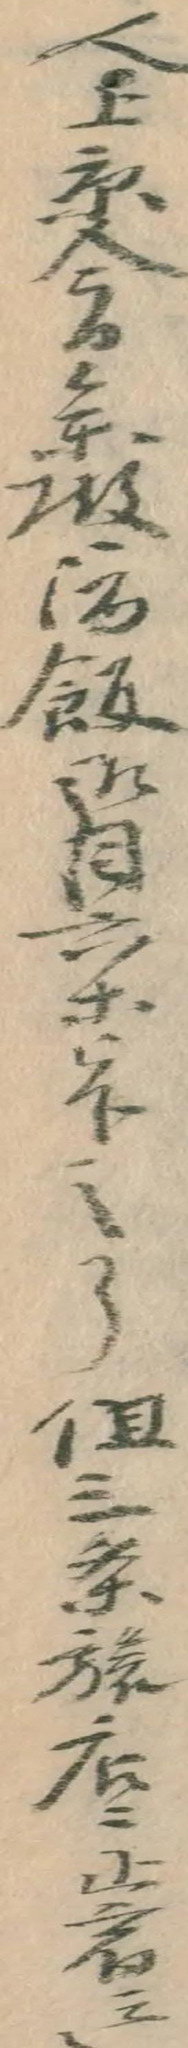人上京入旨参殿御酒飯御目六等被下之了但三條旅店に止宿云々

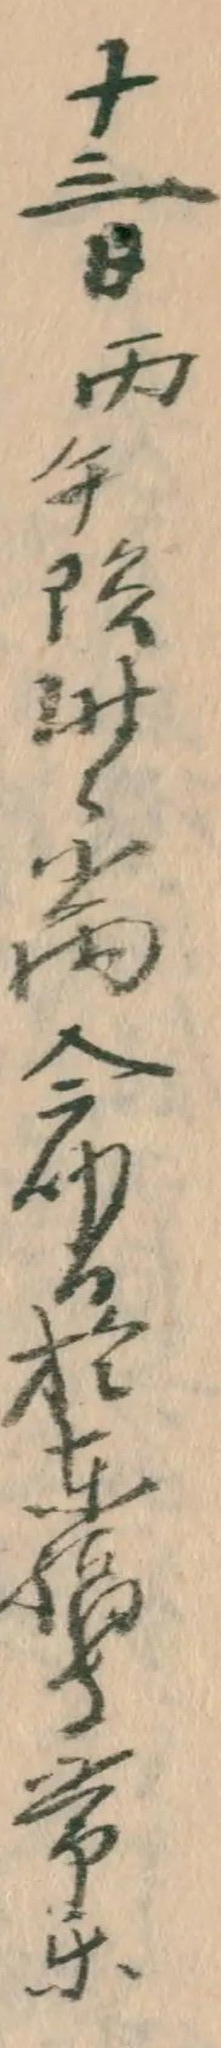十三日丙午陰時々小雨今明日於東福寺常楽
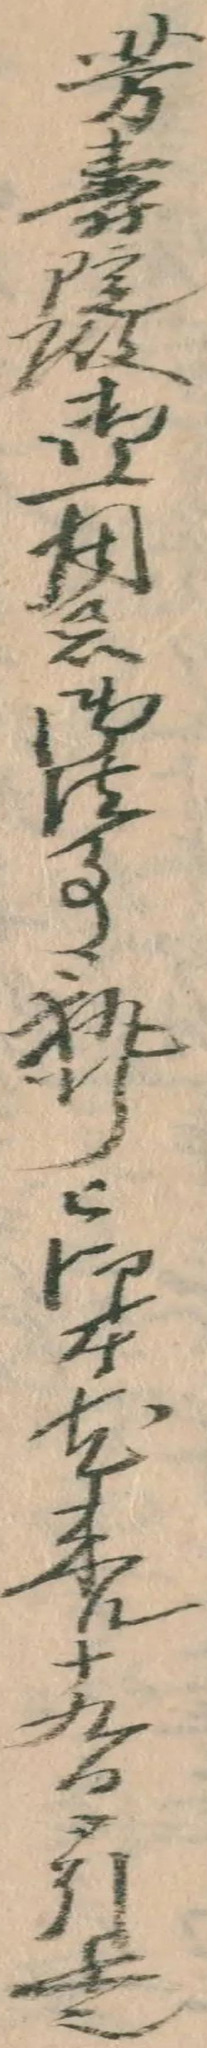芳壽院殿御一周忌御法事御執行被仰付尤来ル十九日御引上也
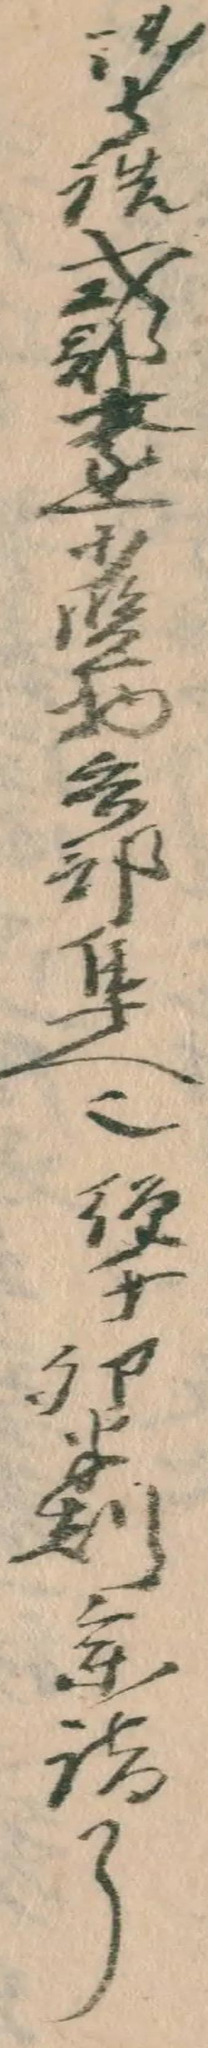御寺詰式部大丞少監物兵部隼人也経千卯半刻参詣了
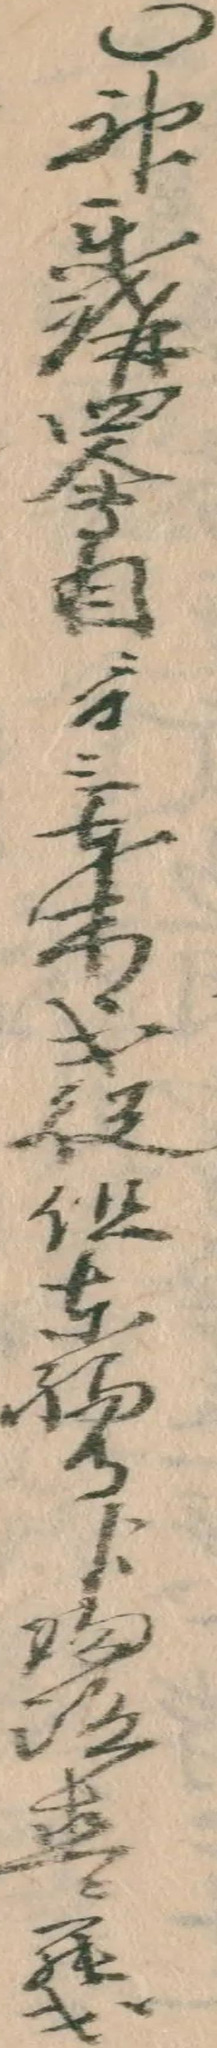◯神楽講四會目ニ付三本木出役但東福寺ゟ帰洛直ニ罷出
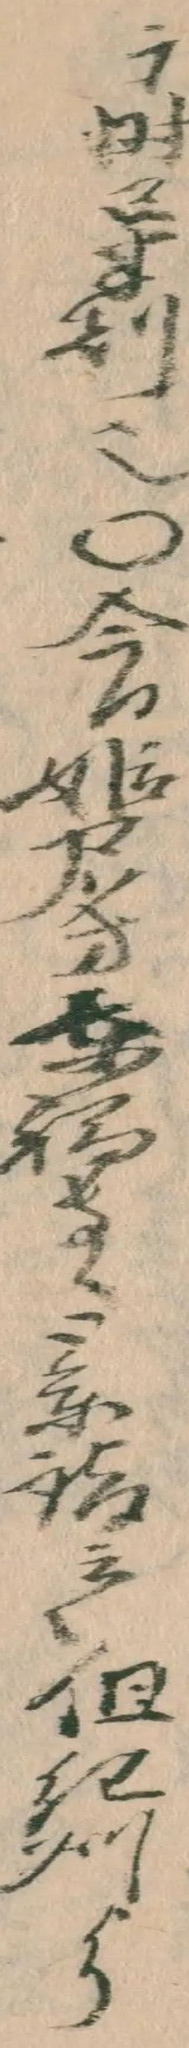于時巳半刻也○今日姫君方東福寺へ御参詣云〻但紀州より
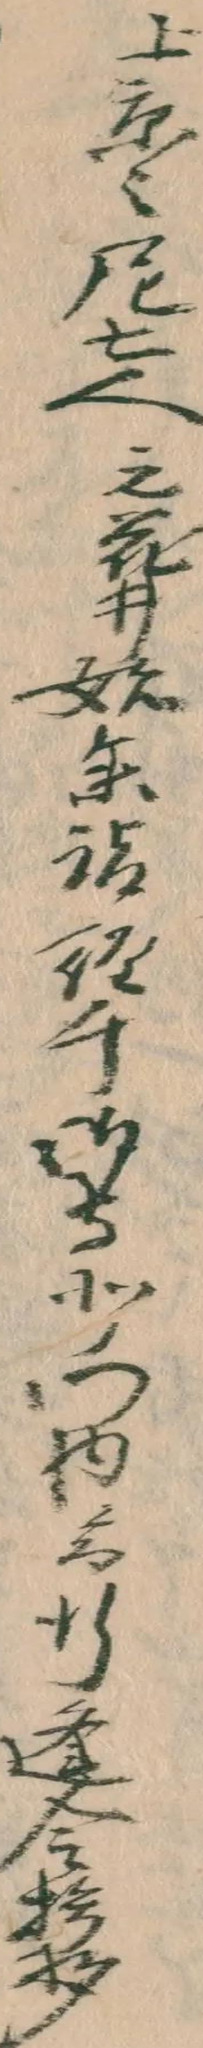上京々尼七人元花井始参詣経千御寺北ノ門内ニ而行逢令挨拶
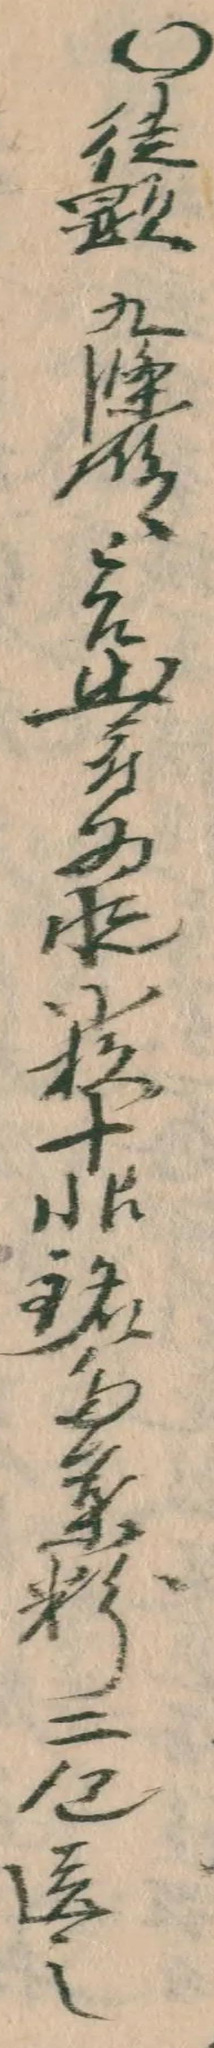○徒顕九條殿へ被召出ニ付為祝小杦十帖銘多葉粉二包送也
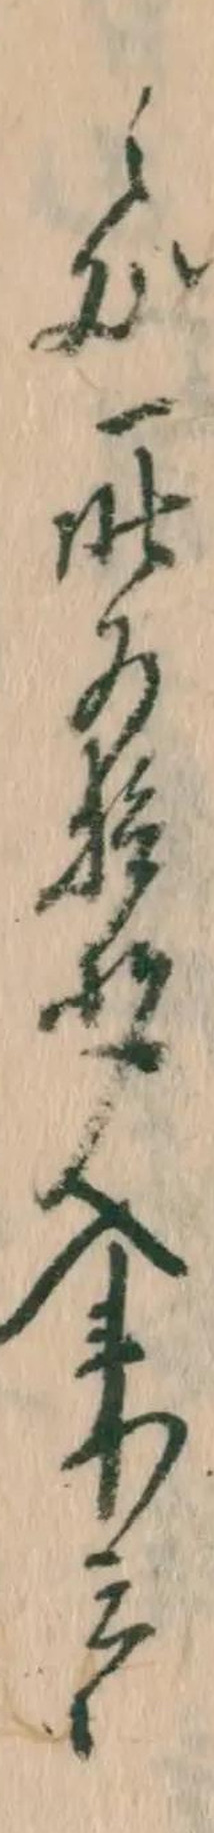之処一昨為挨拶入来也
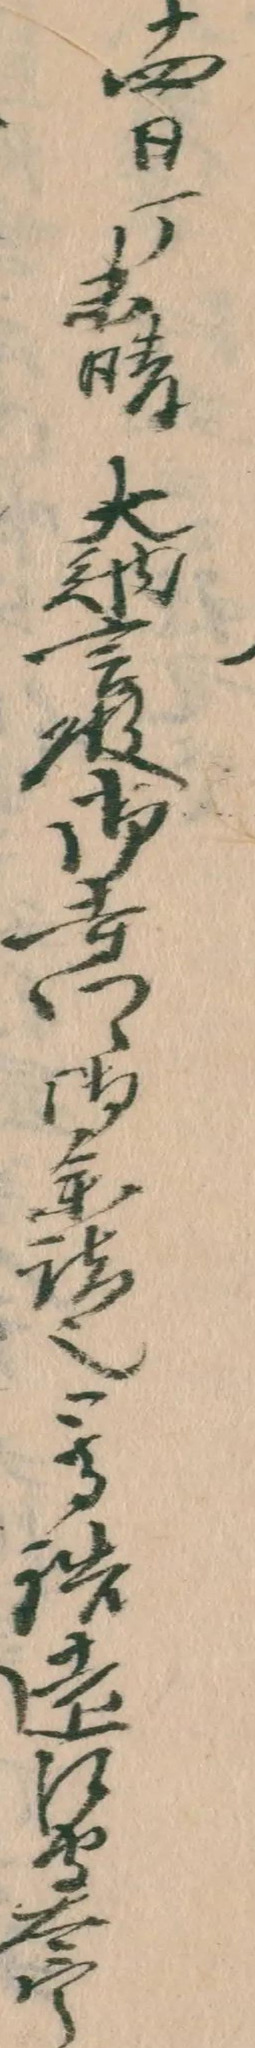十四日丁未晴大納言殿御寺門へ御参詣也御寺詰遠江守太宰
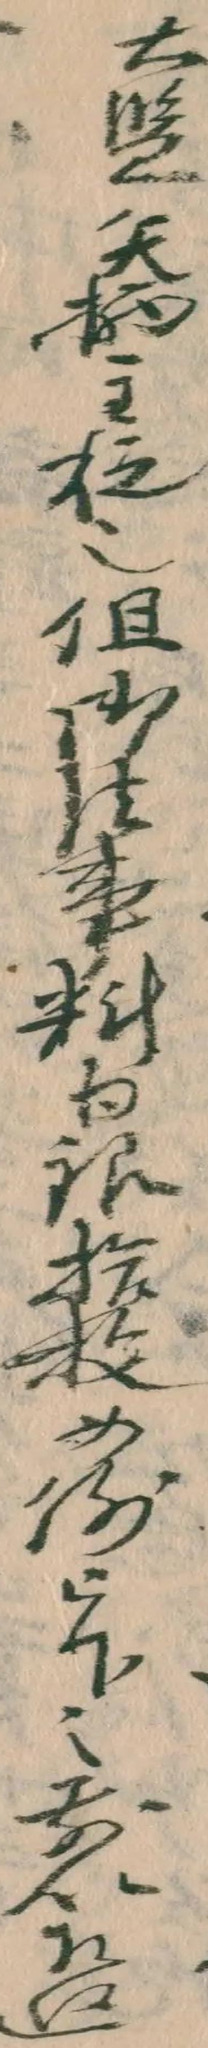大監矢柄主税也但御法事料白銀拾枚如例被下也前以相廻也
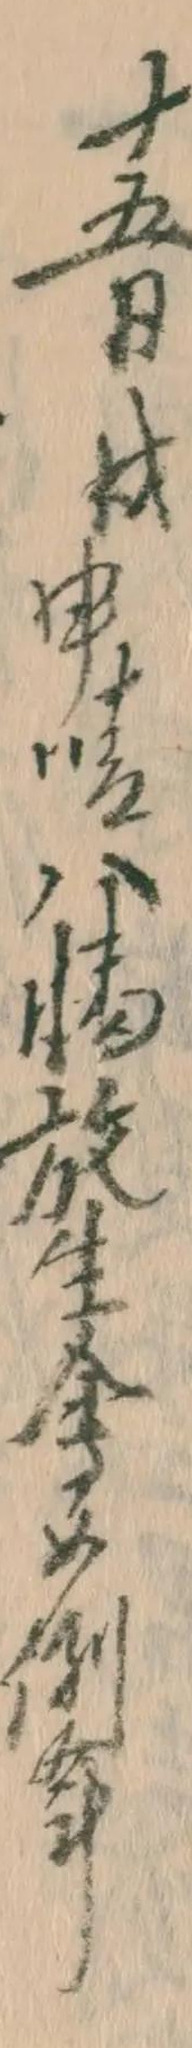十五日戊申晴八幡放生會如例年
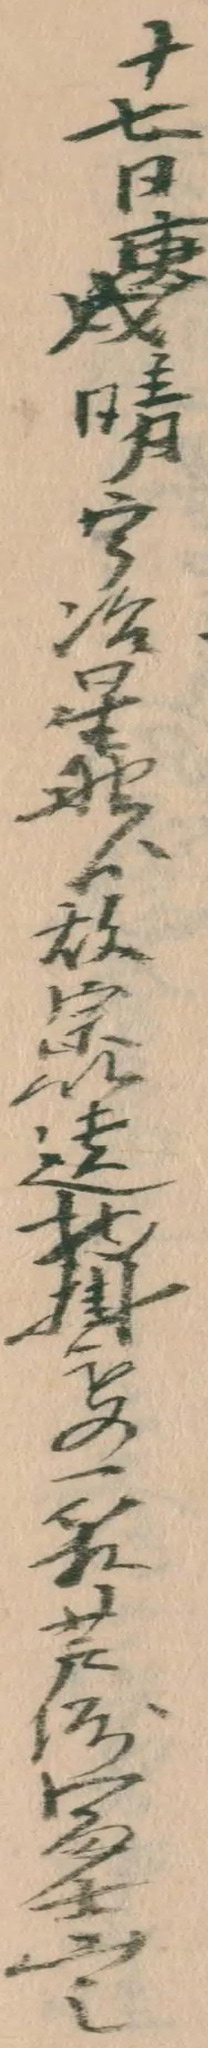十七日庚戌晴宇治星野ゟ故宗以遺物掛もの一箱芦洲富士山之
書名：賀茂社記録. 第69冊
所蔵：国立国会図書館 National Diet Library, JAPAN
